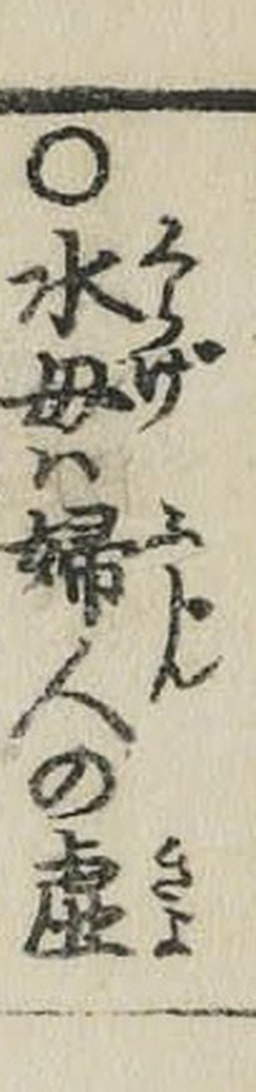○水母は婦人の虚
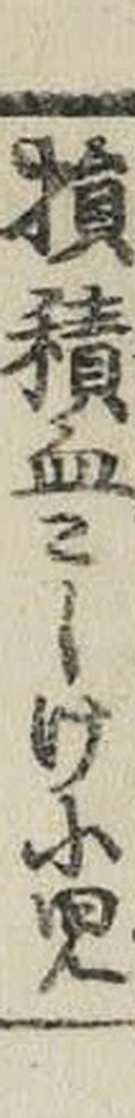損積血こしけ小児
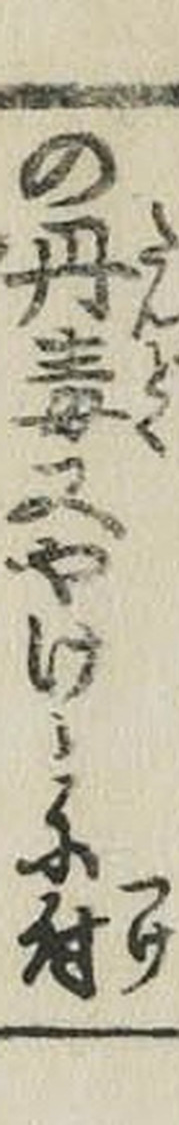の丹毒又やけとに付
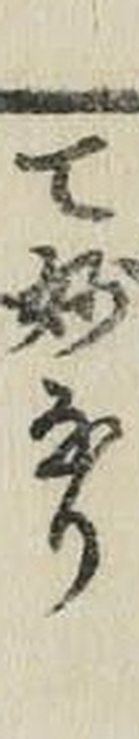て妙なり
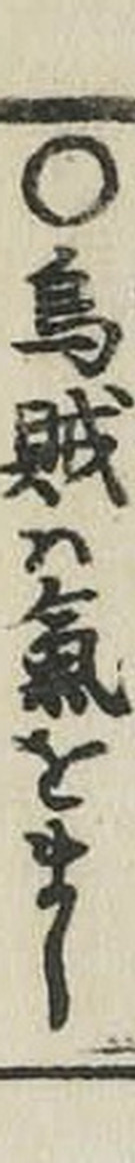○烏賊は気をまし
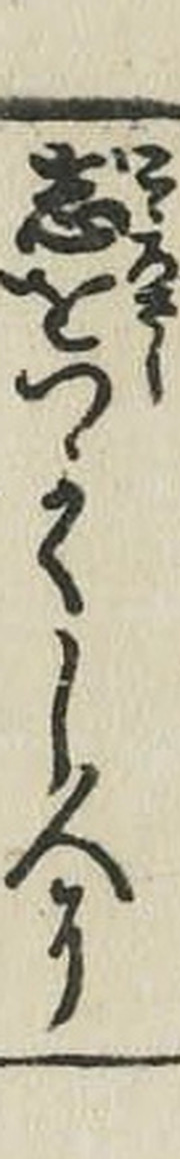志をつよくし人に
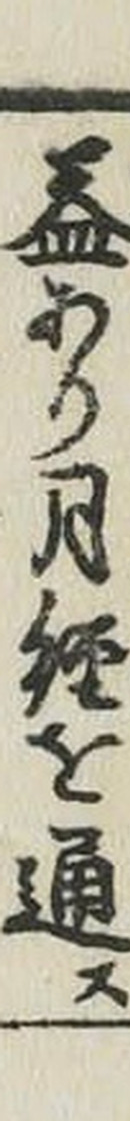益あり月経を通す
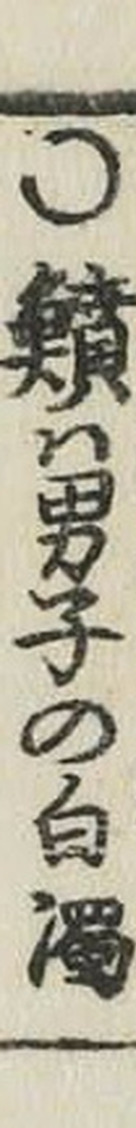○鱝は男子の白濁
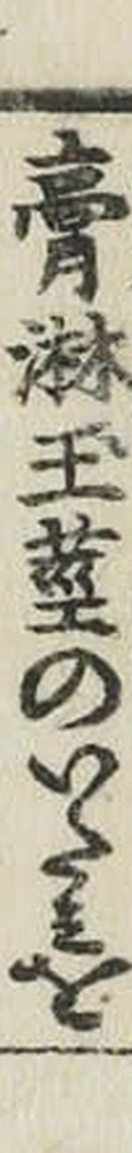膏淋玉茎のいたみを
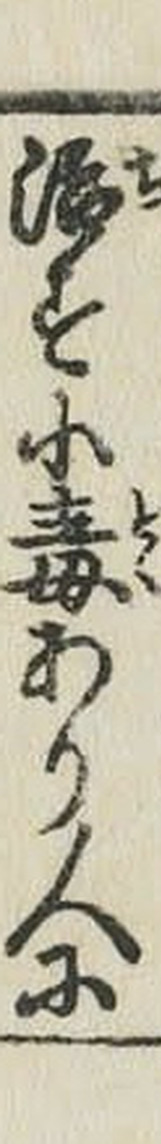治す小毒あり人に
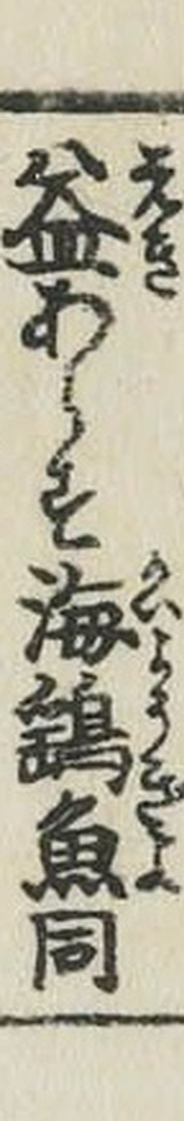益あらす海鷂魚同
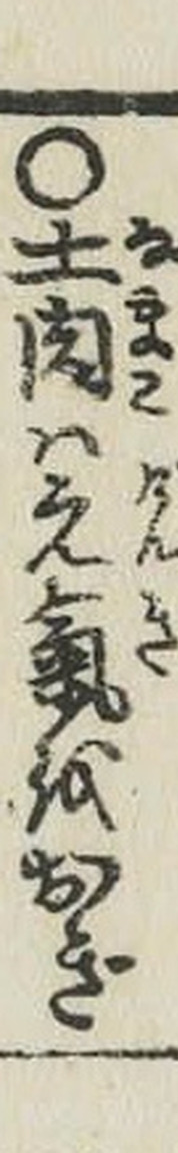○土肉は元気をおぎ
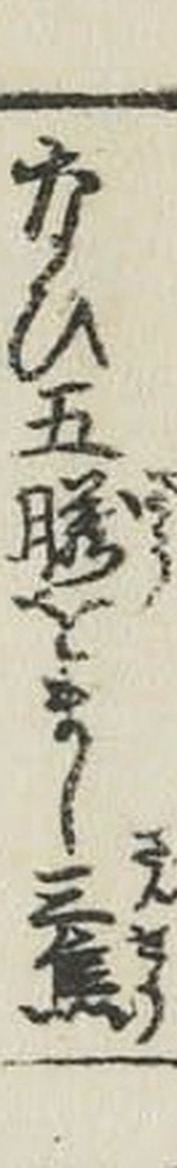なひ五臓をまし三焦
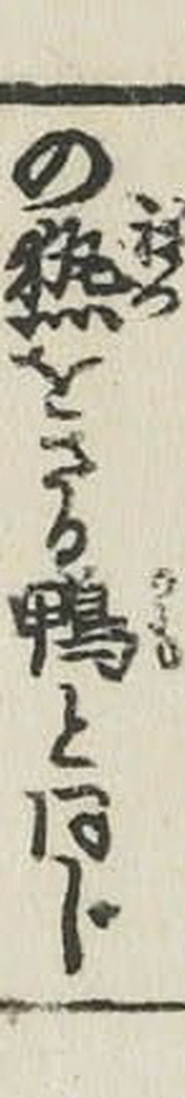の熱をさる鴨と同じ
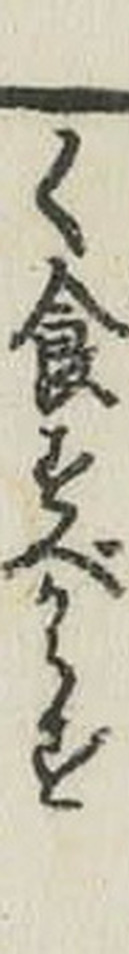く食すべからず
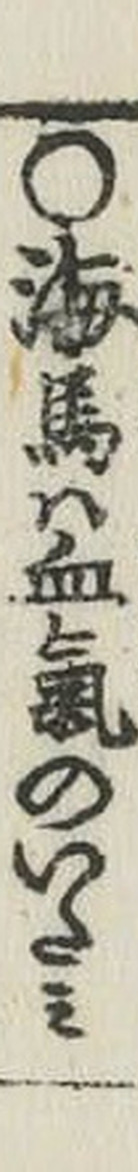○海馬は血気のいたみ
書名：増補頭書訓蒙図彙大成 10巻 7:巻之14-16
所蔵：東京学芸大学教育コンテンツアーカイブ
